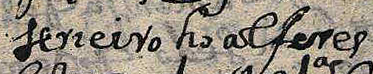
serieiro ho alferes
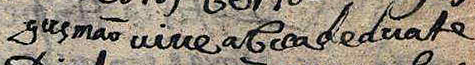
gusmaõ uiue a bica de duate
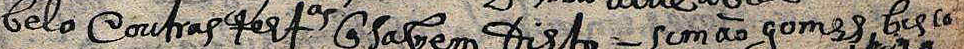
belo e outras testas q̄ sabem Disto simão gomes bisco
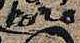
teiro
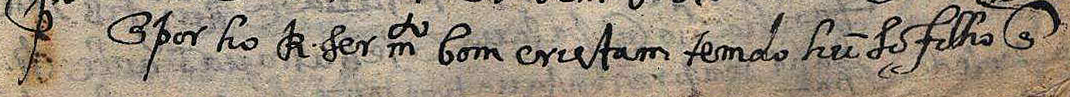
Pra q̄ por ho R. ser mto bom cristam temdo hū so filho q̄
